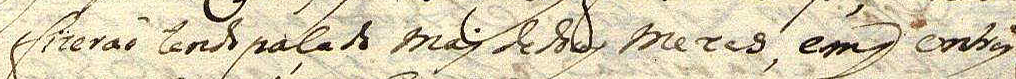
fizeraõ tendo paÇado mais de dous mezez, em q̄ emtrey
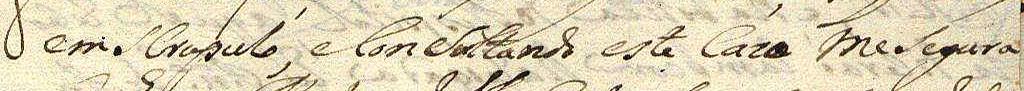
em sCrepulo, e ConSultando esta Caza me segura
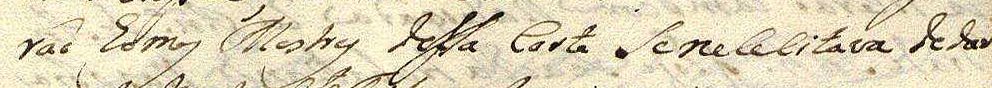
raõ homes Mestres dessa Corte se neCeCitava de dar
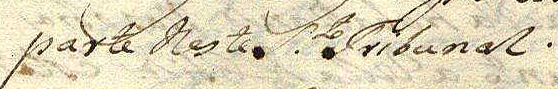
parte neste S.to Tribunal.
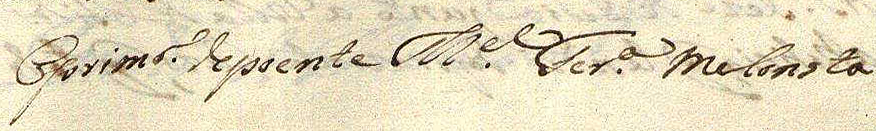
O primr.o depoente M.el Fer.a me Consta
